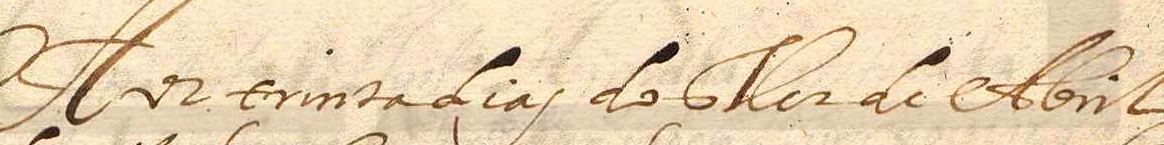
Aos trinta dias do Mez de Abril
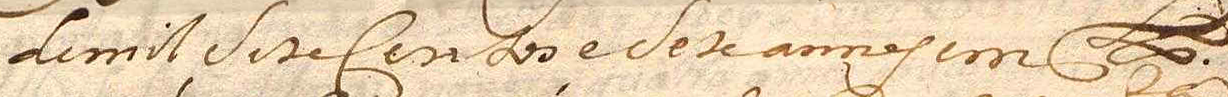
de mil, seteCentos e sete annos em Lx.a
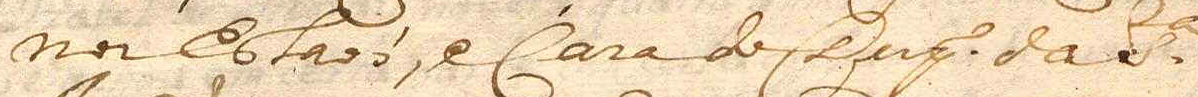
nos Estaós, e Caza do Desp.o da s.ta
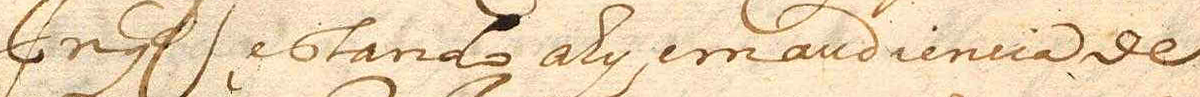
Jnq.caõ, estando ahy em audiencia de
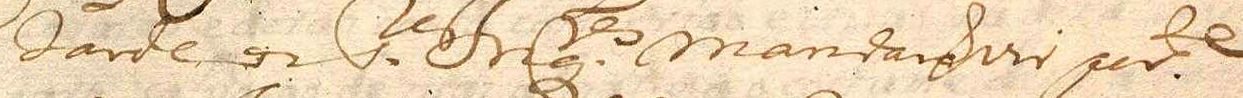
tarde os s.res Inq.res mandaraõ vir per.te
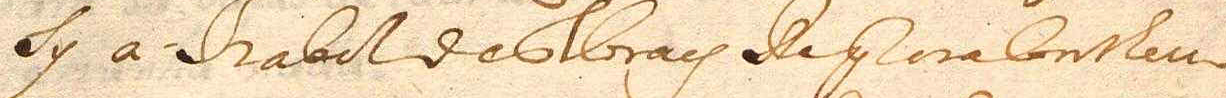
sy a Izabel de Moraes Re preza Contheu
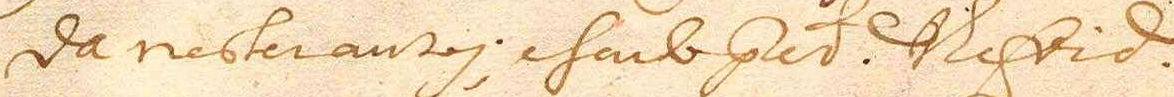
da nestes autos; e sendo pRez.te lhe foi d.o
